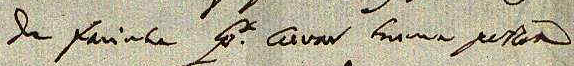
de farinha p.a curar huma pessoa
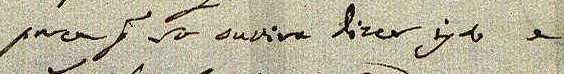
para q̄ se ouvira dizer isto e
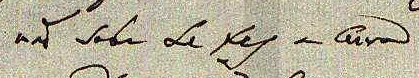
naõ sabe se fes a Cura
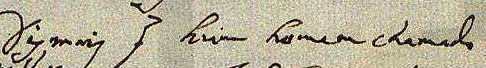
Dis mais q̄ hum homem chamado
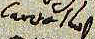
Carvalho
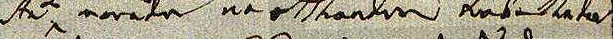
Anto morador na Alhandra trabalhador
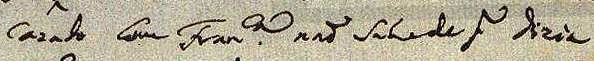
cazado Com Fran.ca naõ sabe de q̄ dizia
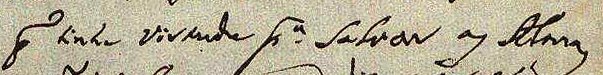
po tinha virtude p.a salvar as Almas
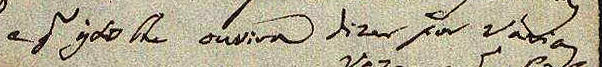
e q̄ isto lhe ouvira dizer por Varias
